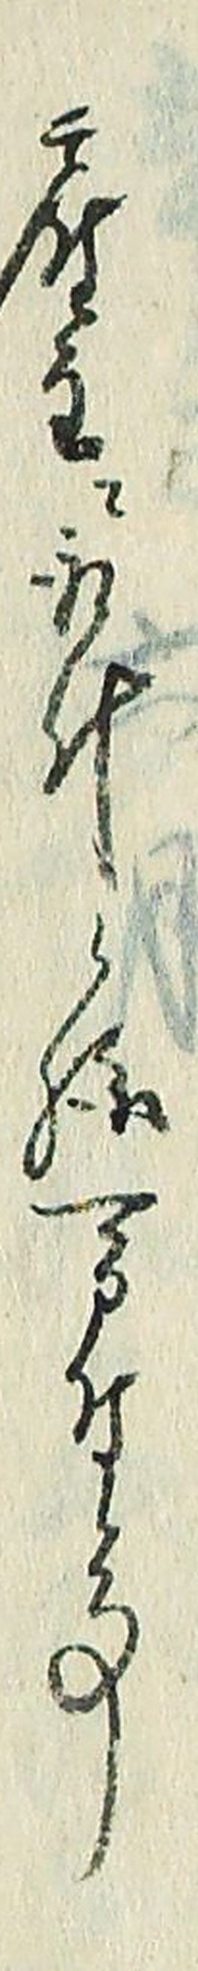雇主ニ取計候様可申付候事
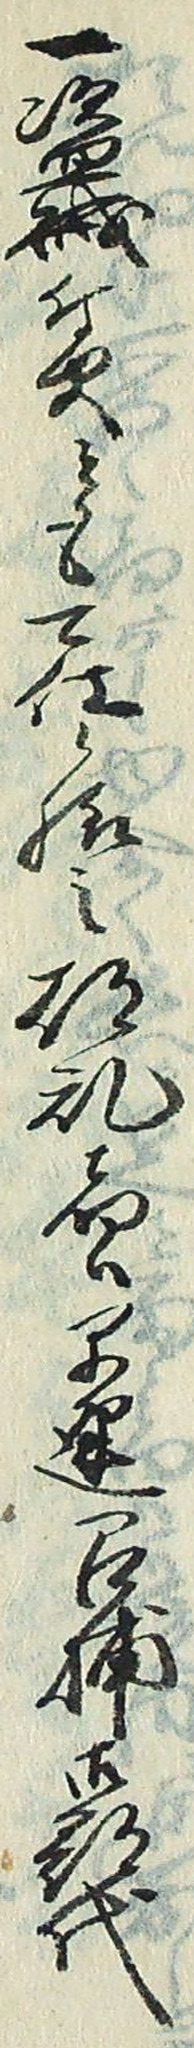一盗賊付火をも可仕候様之胡乱者ハ早速召捕御郡代
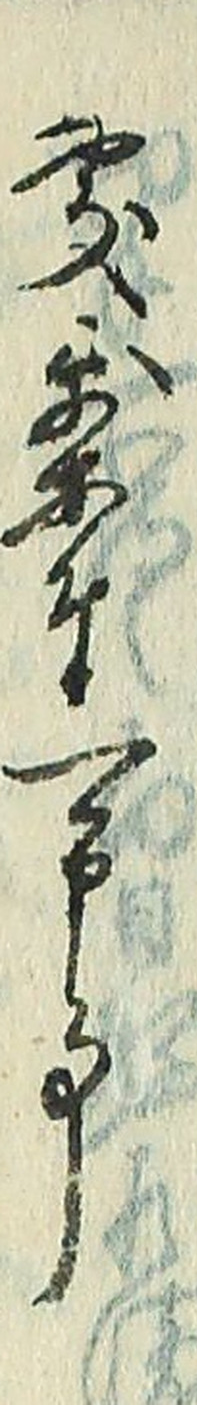處へ案付可申事
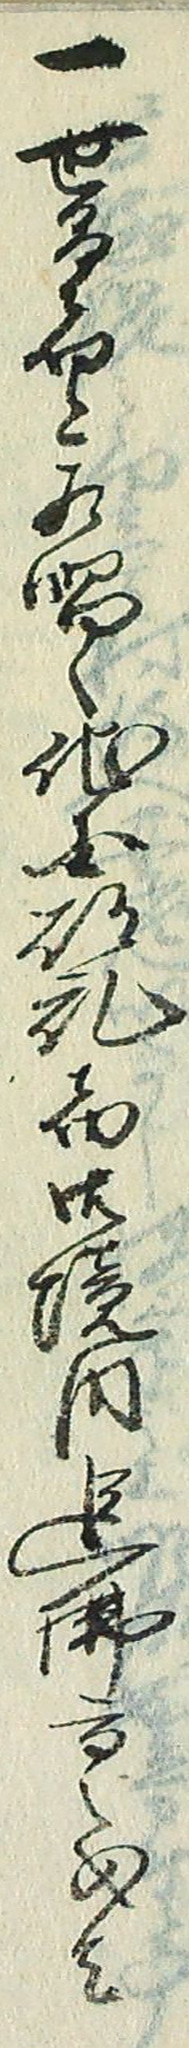一世間者と相唱候他国胡乱者御境目追拂方之義者
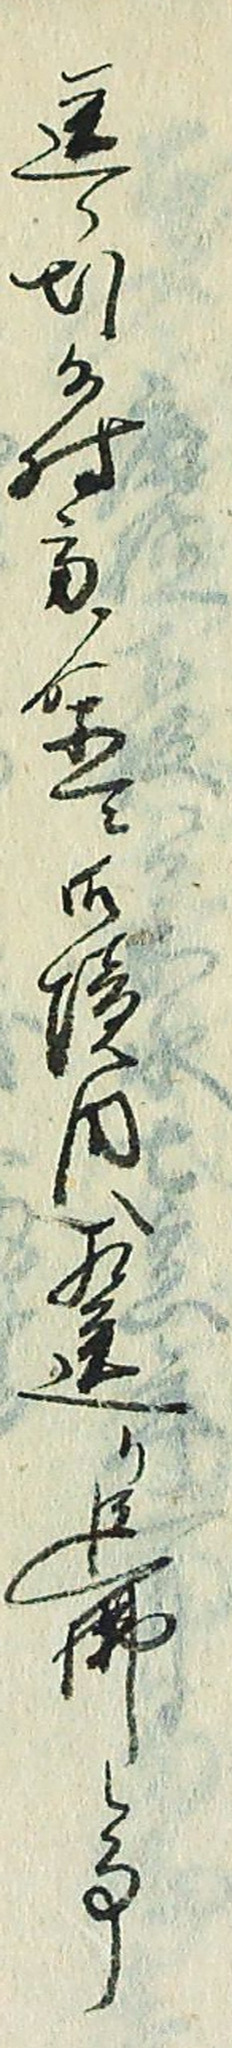送り出候村方ゟ直ニ御境目へ相送り追拂候事
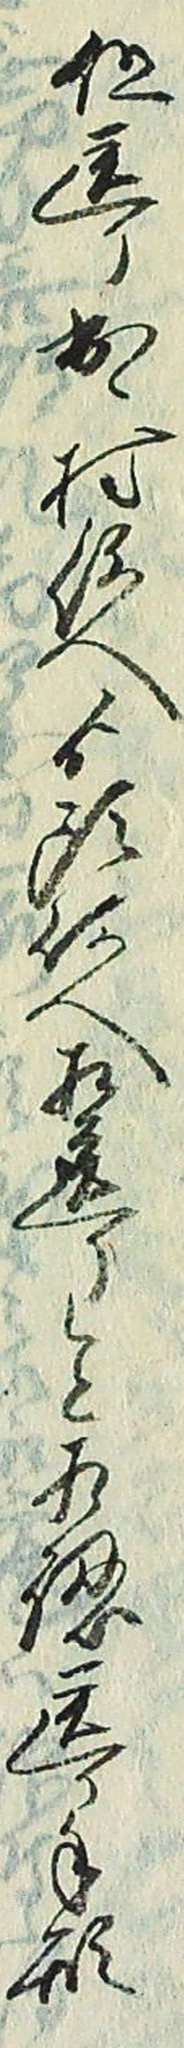但送り出候村役人ゟ頭何人相送り候と相認送り手形
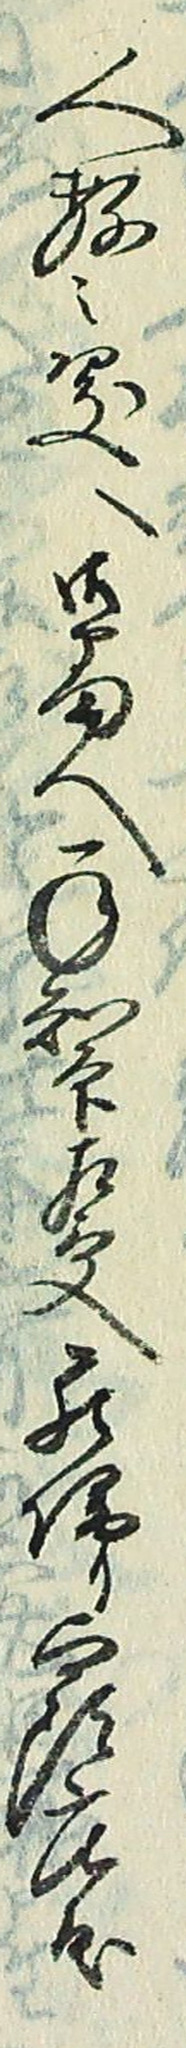人数之處へ御番人承知印相受罷帰り与頭庄屋
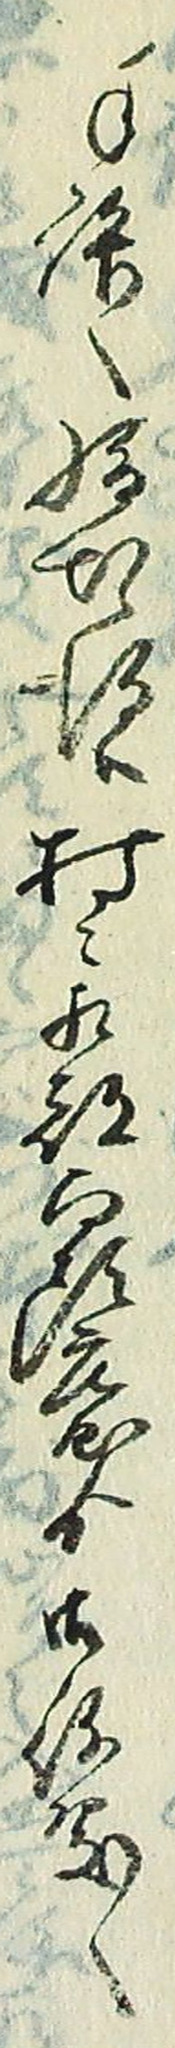手許へ指出候得ハ村々相都与頭庄屋ゟ御役處へ
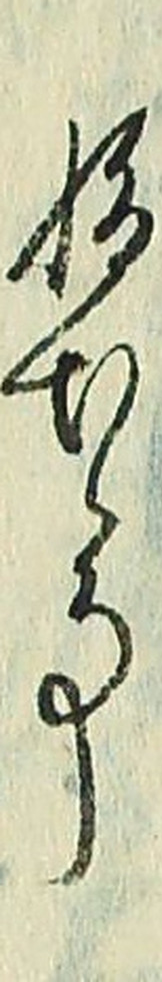指出候事
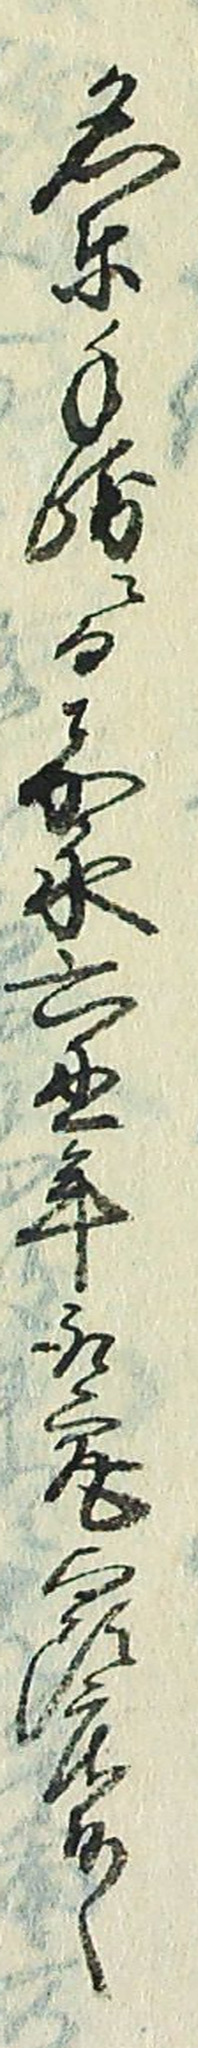名東手崎ニ而嘉永六丑年取究与頭庄屋へ
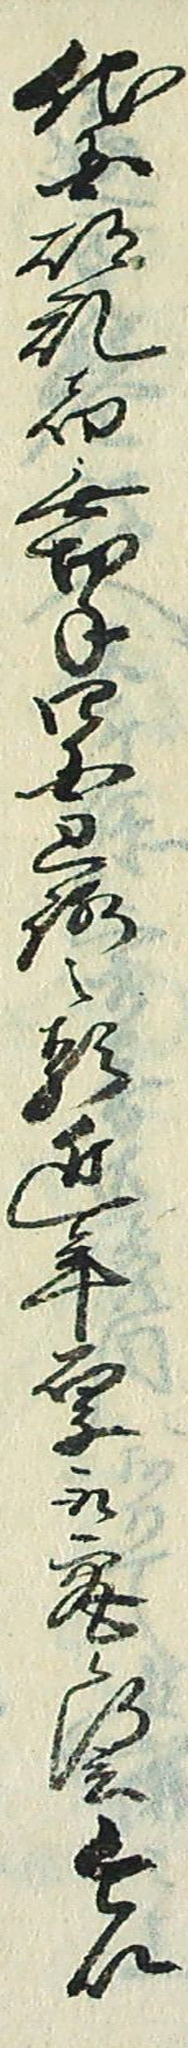他国胡乱者無切手四国辺路之類近年厚取究候得共今以
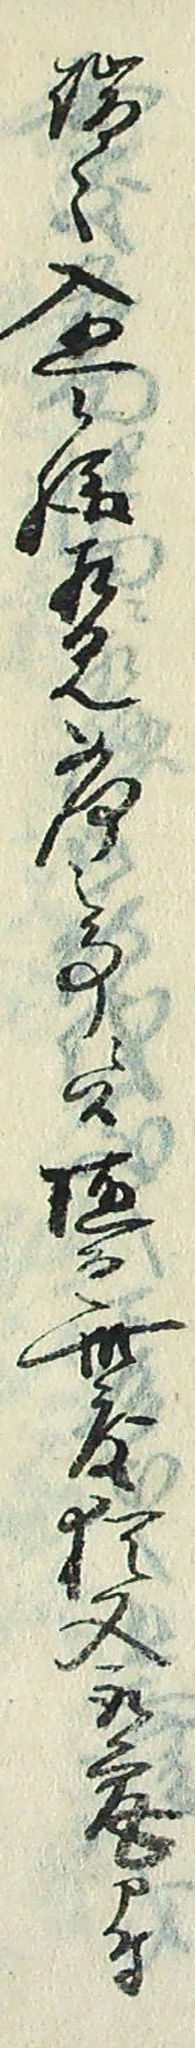端々入込候様相見如何之事ニ候随而此度猶又取究申付
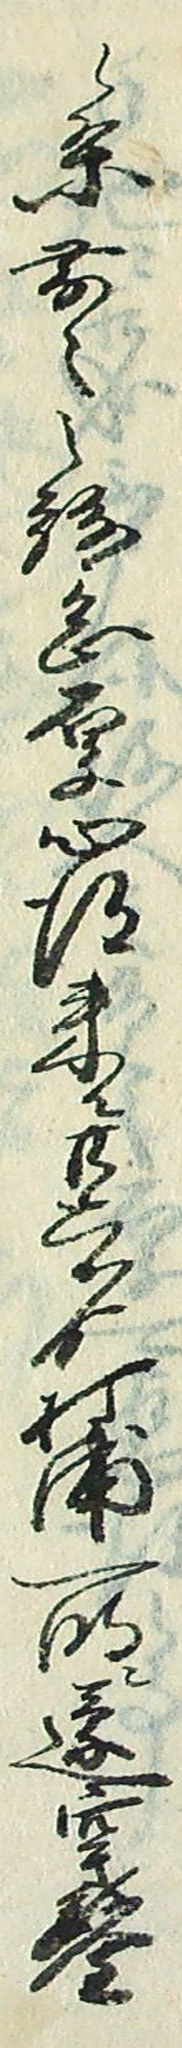候条前々之趣意厚心得来ル廿六日ゟ村浦一時ニ遂穿鑿
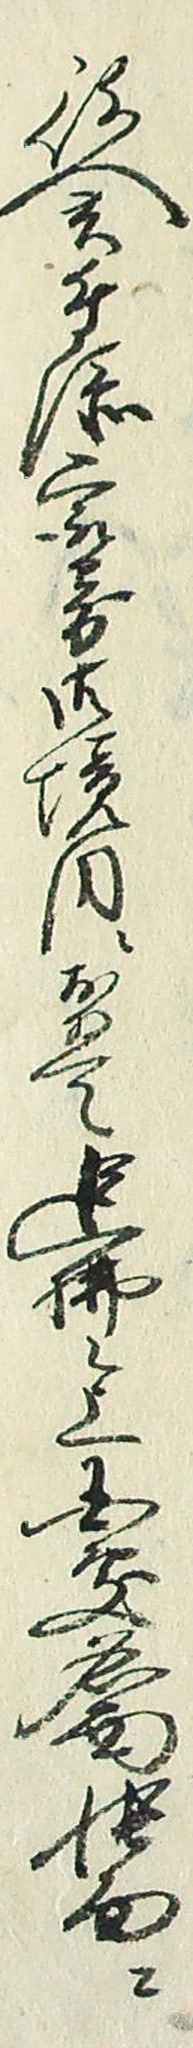役人共付添最寄御境目ニおゐて追拂之上国處名面帳面ニ

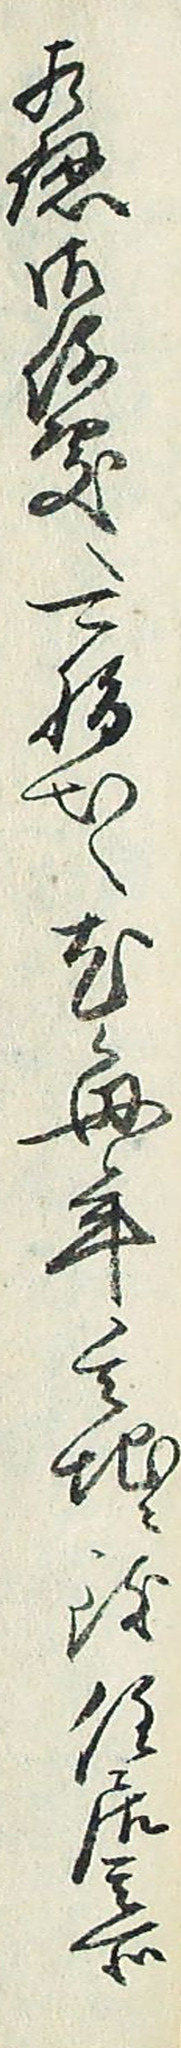相認御役處へ可指出候尤毎年其地ニ致住居其所
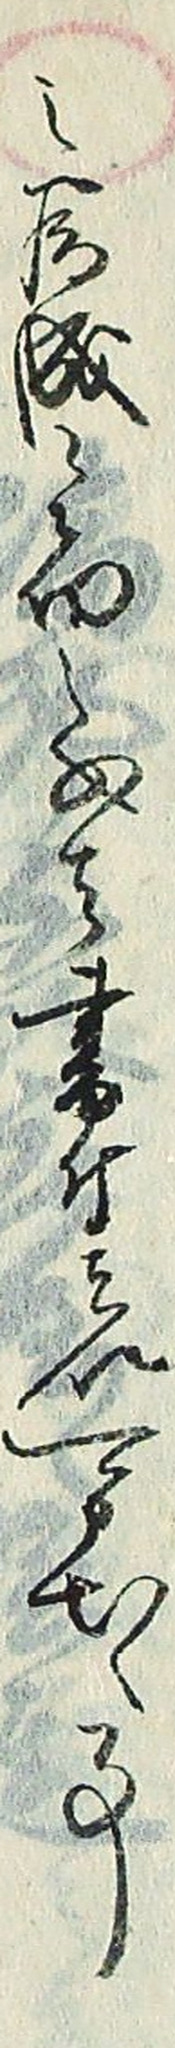之為成候者之義者書付を以可申出候事
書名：諸御趣意書并御下知向之写
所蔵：鳴門教育大学 Naruto University of Education
